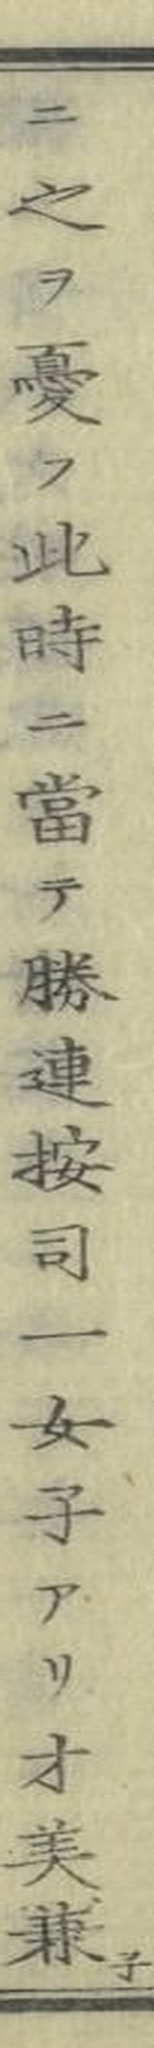ニ之ヲ憂フ此時二當テ勝連按司一女子アリ才美兼

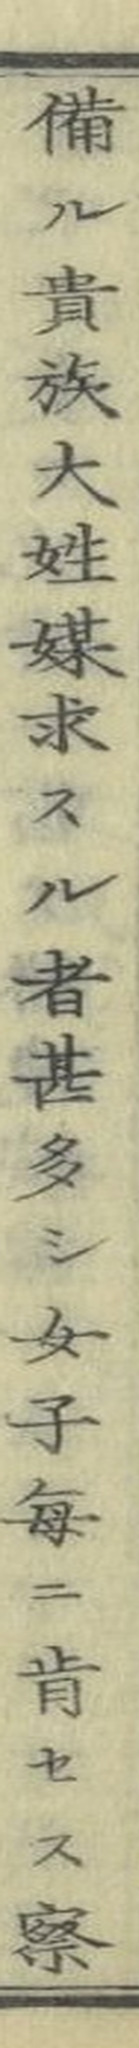備ル貴族大姓媒求スル者甚多シ女子每ニ肯セス察
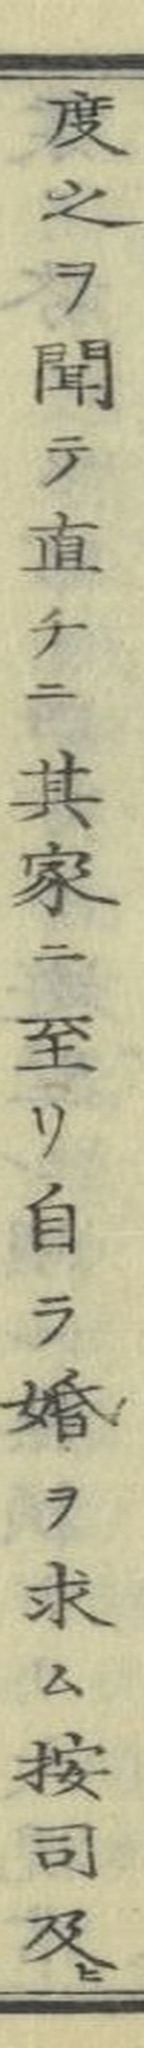度之ヲ聞テ直チニ某家ニ至リ自ラ婚ヲ求ム按司及
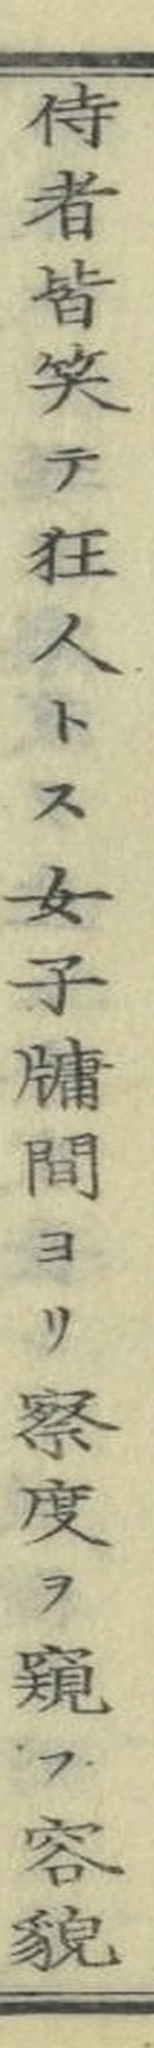侍者皆笑テ狂人トス女子牗間ヨリ察度ヲ窺フ容貌
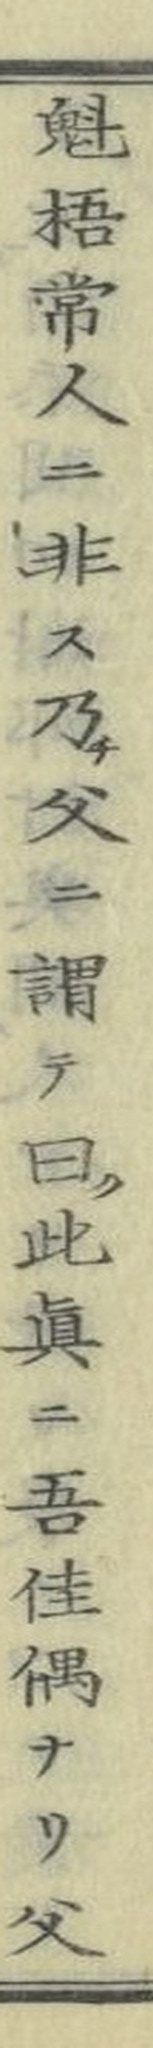魁梧常人ニ非ス乃父ニ謂テ曰此眞ニ吾佳偶ナリ父
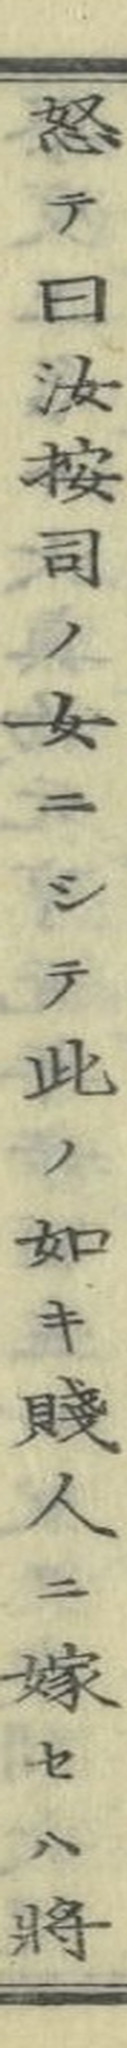怒テ曰汝按司ノ女ニシテ此ノ如キ賤人ニ嫁セハ將
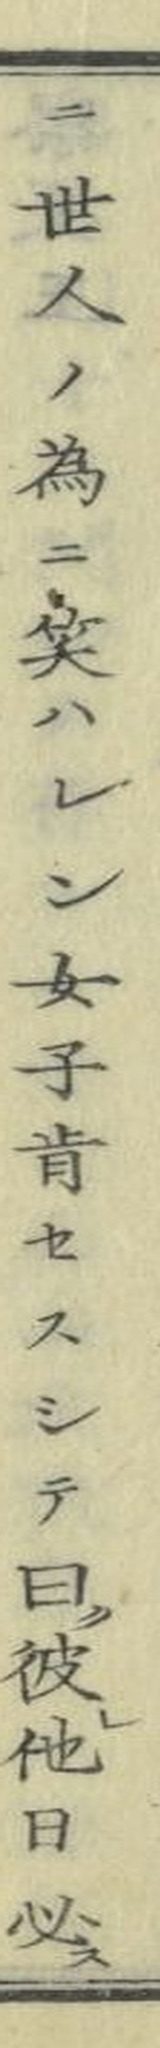ニ世人ノ為ニ笑ハレン女子肯セスシテ曰彼他日必
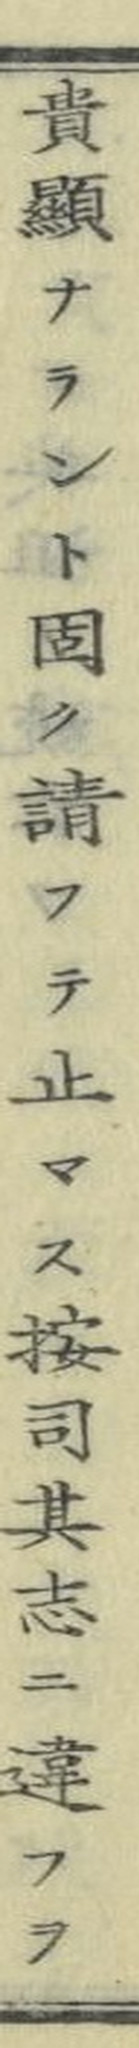貴顯ナラント固ク請フテ止マス按司共志ニ違フヲ
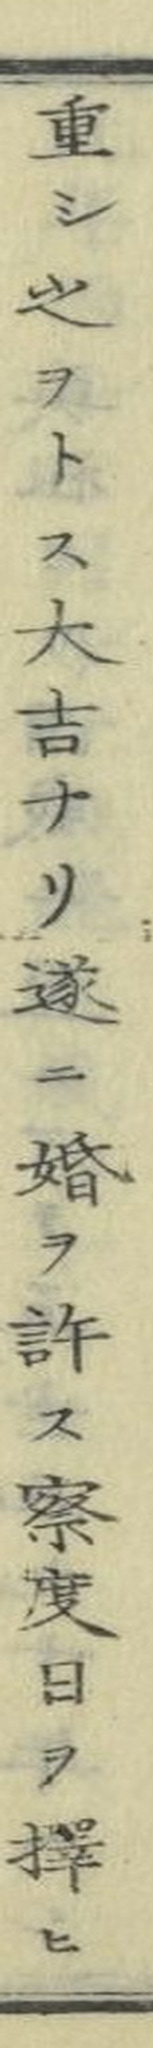重シ之ヲトス大吉ナリ遂ニ婚ヲ許ス察度日ヲ擇ヒ
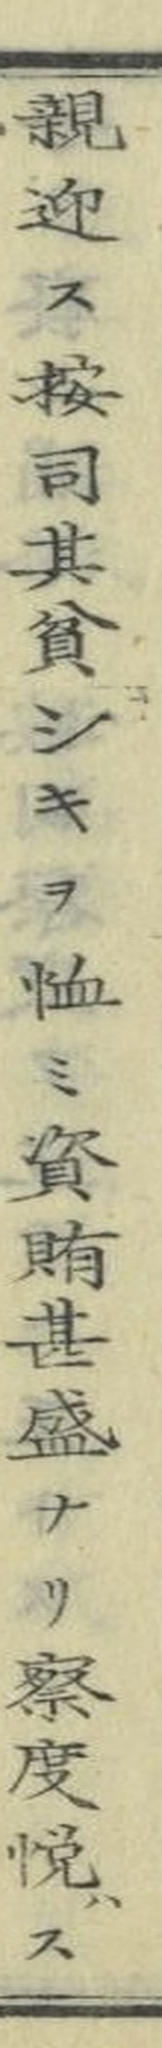親迎ス按司其貧シキヲ恤ミ資賄甚盛ナリ察度悦ス
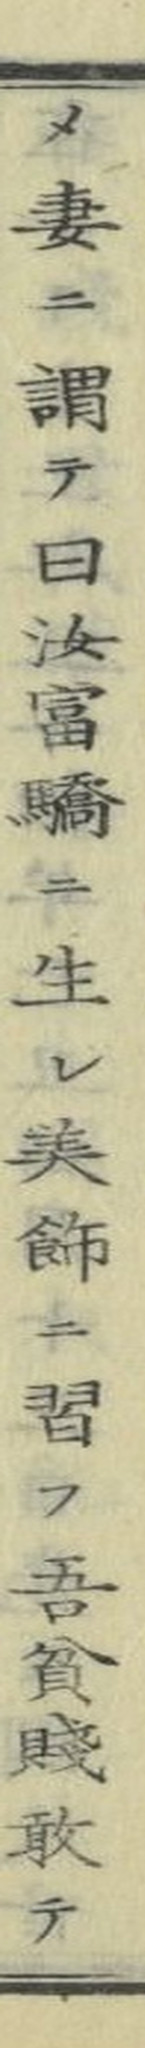コト妻ニ謂テ曰汝富驕ニ生レ美飾ニ習フ吾貧賤敢テ
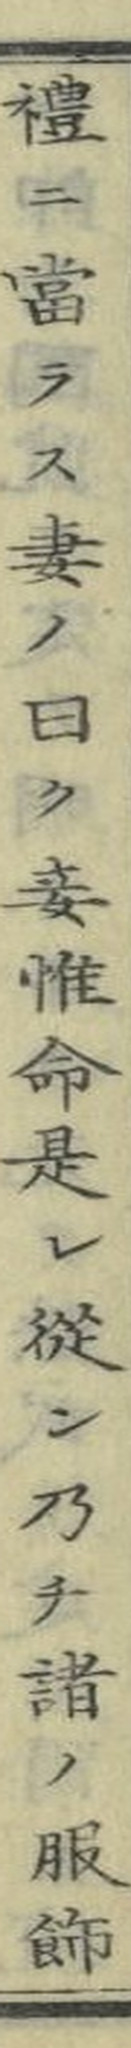禮ニ當ラス妻ノ曰ク妾惟命是レ從ン乃チ諸ノ服飾
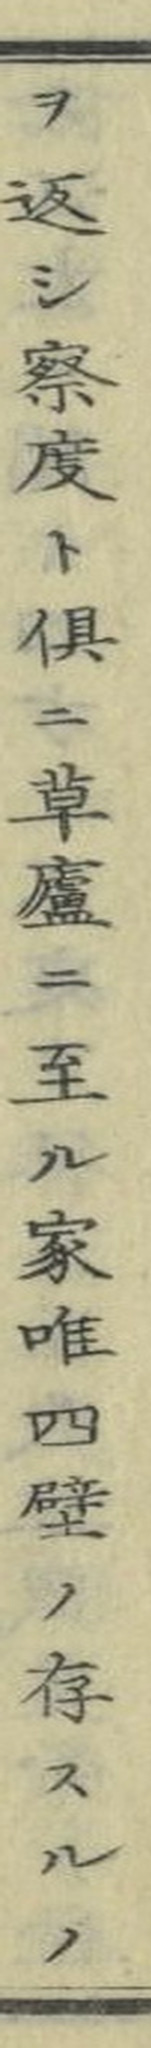ヲ返シ察度ト俱ニ草廬ニ至ル家唯四壁ノ存スルノ
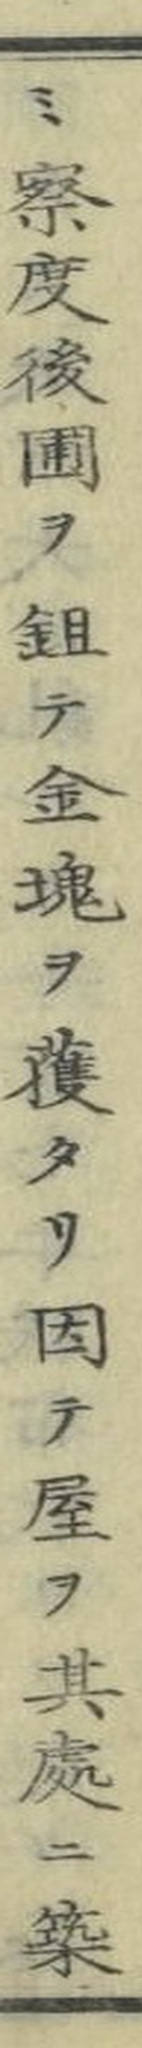ミ察度後圃ヲ鉏テ金塊ヲ獲タリ因テ屋ヲ共處ニ築
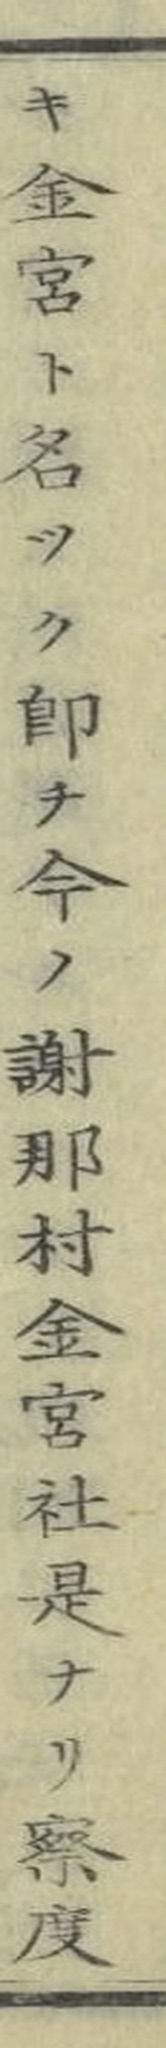キ金宮ト名ツク即チ今ノ謝那村金宮社是ナリ察度
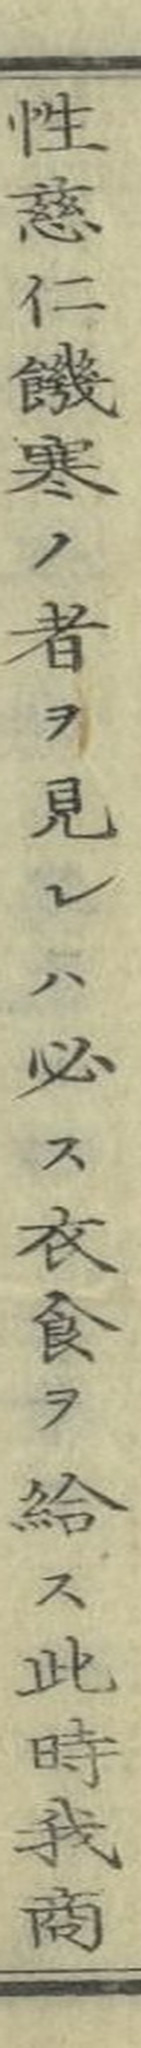性慈仁饑寒ノ者ヲ見レハ必ス衣食ヲ給ス此時我商
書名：琉球藩史 一之巻
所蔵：University of the Ryukyus Library
